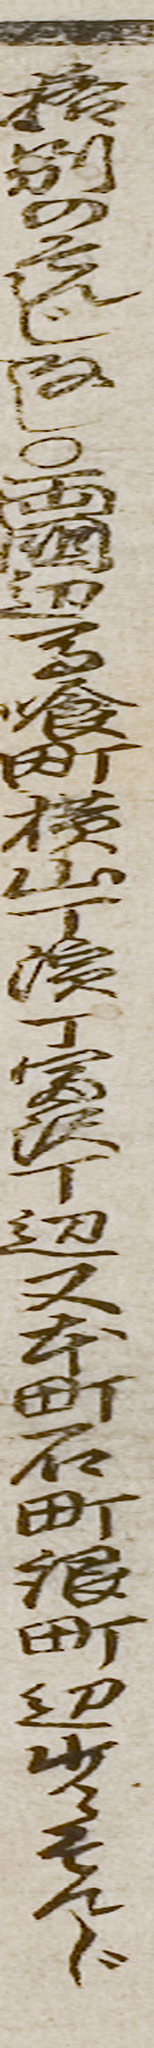格別のそんじなし○両国辺馬喰町横山丁浜丁富沢丁辺又本町石町銀町辺少々そんじ
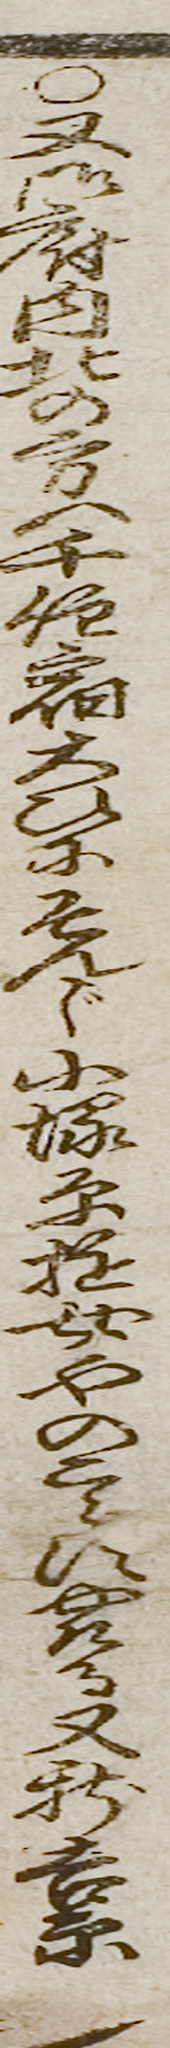○又御府内北の方へ千住宿大ひにそんじ小塚原遊女やのこらすやける又新吉原
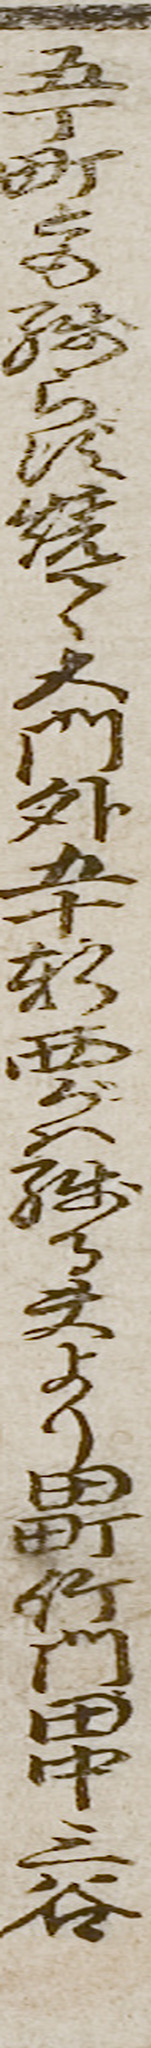五丁町とも残らず焼て大門外五十軒西がハ残る夫より田町竹門田中三谷
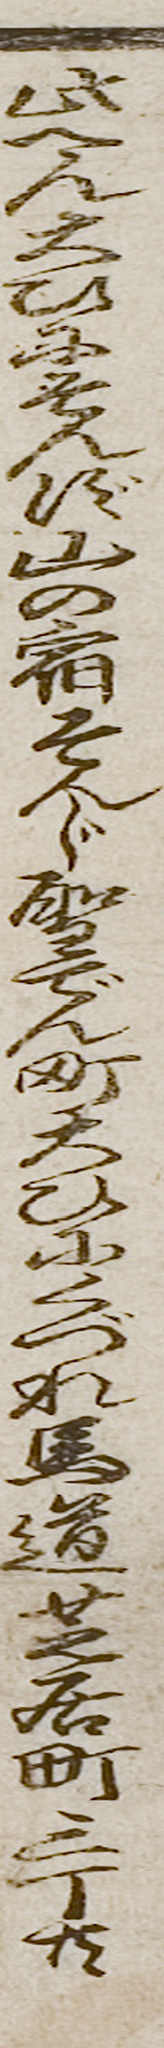此へん大ひにそんず山の宿そんじ聖でん町大ひにくづれ馬道芝居町三丁共
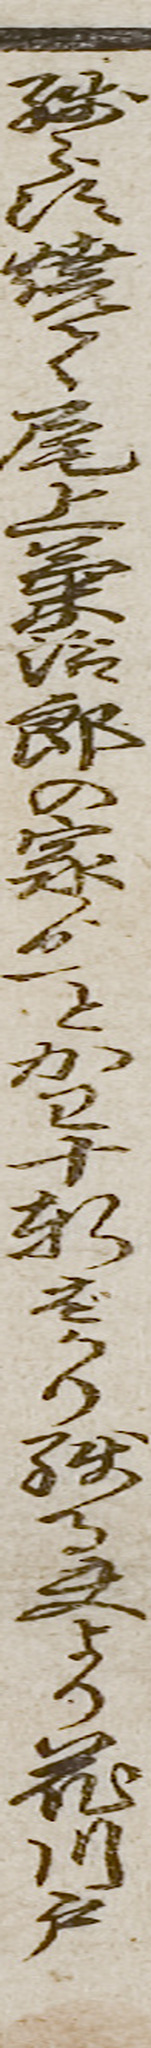残らす焼て尾上菊治郎の家より一とかわ十軒ばかり残る夫より花川戸
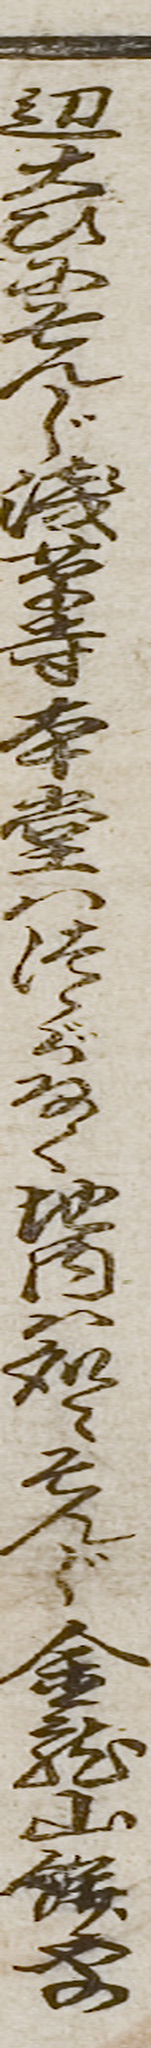辺大ひにそんじ浅草寺本堂ハつゝがなく地内は処々そんじ金龍山餅やの
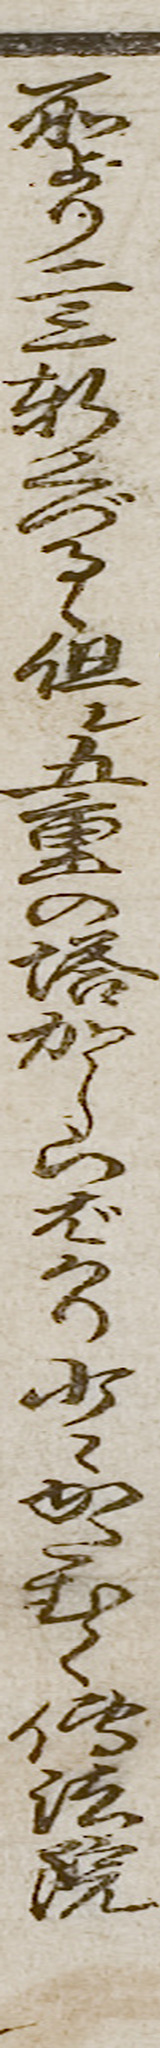所より二三軒くづるゝ但し五重の塔かしらばかり少々かたむく伝法院
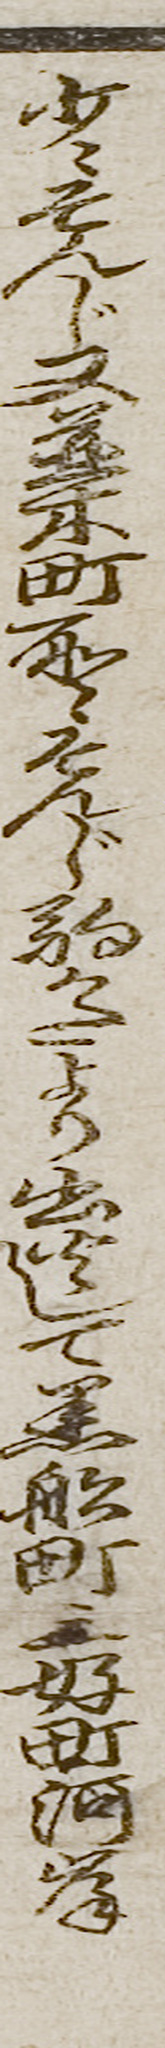少々そんじ又並木町所々そんじ駒かたより出火して黒船町三好町河岸
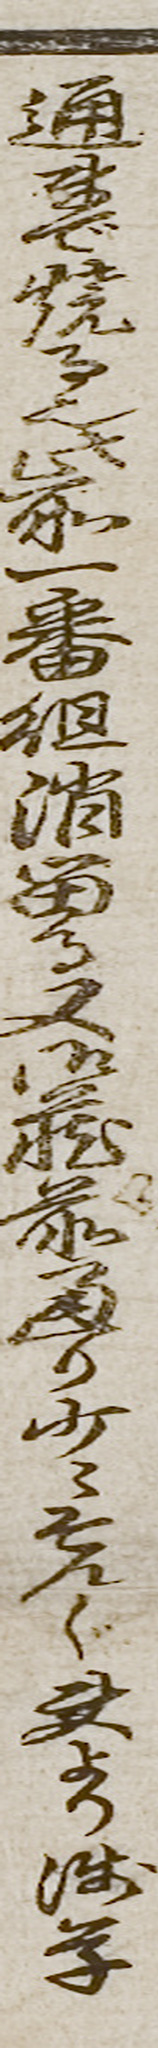通まで焼る也此所一番組消留る又御蔵前通り少々そんじ夫より浅草
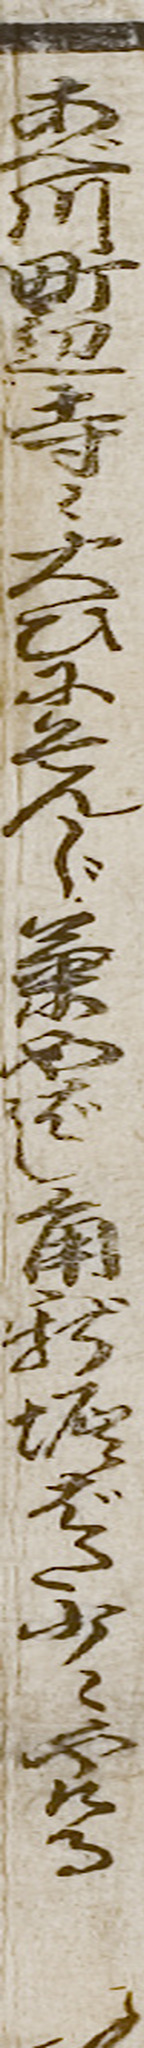あべ川町辺寺々大ひにそんじ菊やばし角新堀ばた少々やける
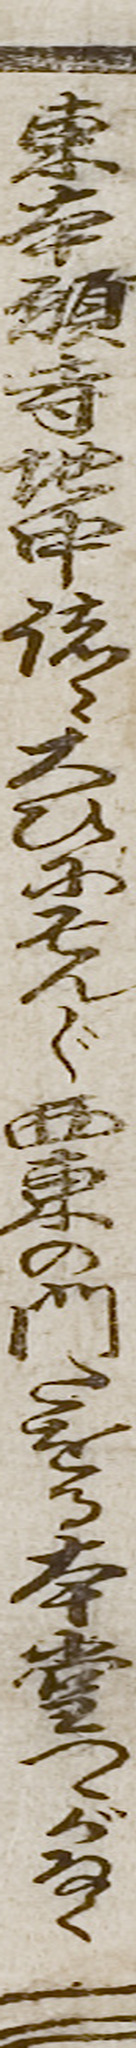東本願寺地中諸々大ひにそんじ西東の門たをる本堂つゝがなく
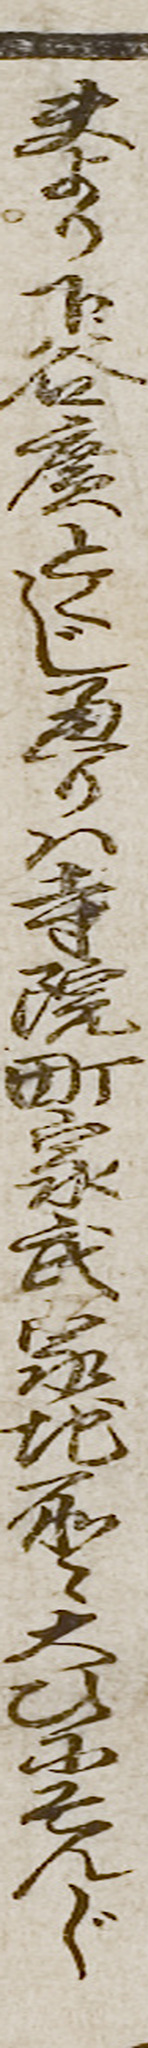夫より下谷広とくじ通りハ寺院町家武家地所々大ひにそんじ
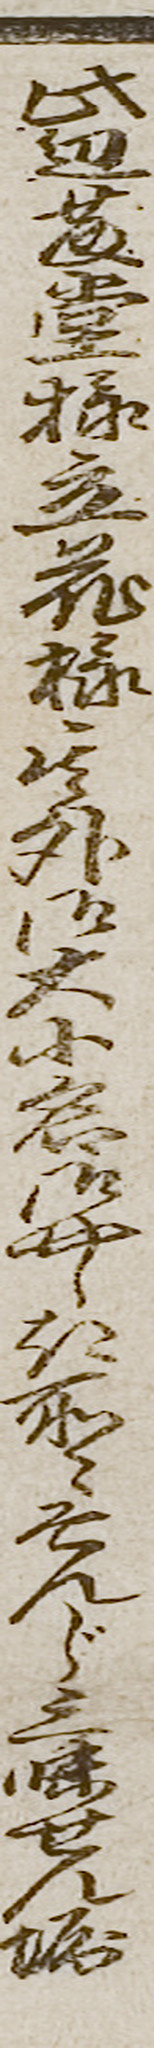此辺藤堂様立花様其外御大小名御やしき所々そんじ三味せん堀
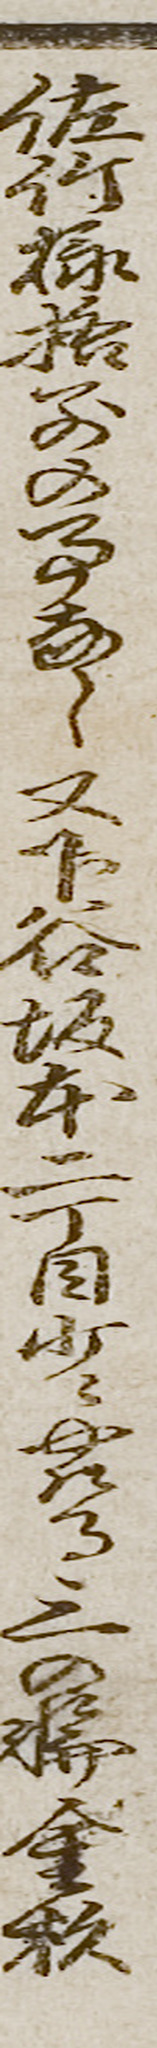佐竹様格別の事なし又下谷坂本二丁目少々やける三の輪金杦
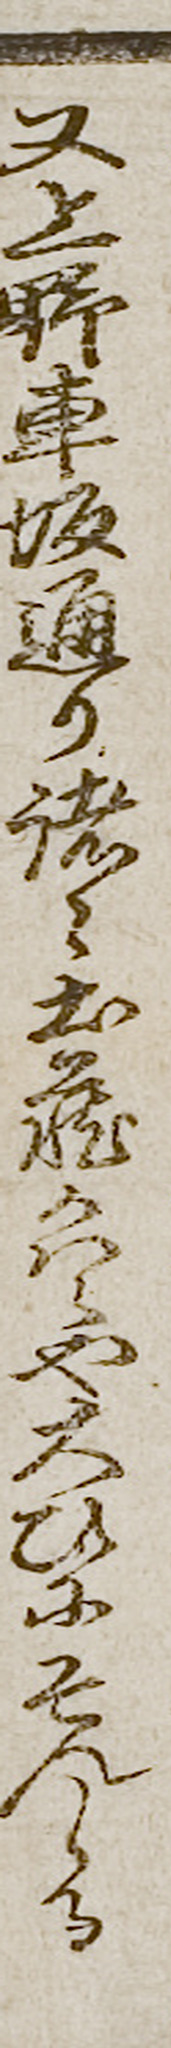又上野車坂通り諸々土蔵かハらや大ひにそんしる
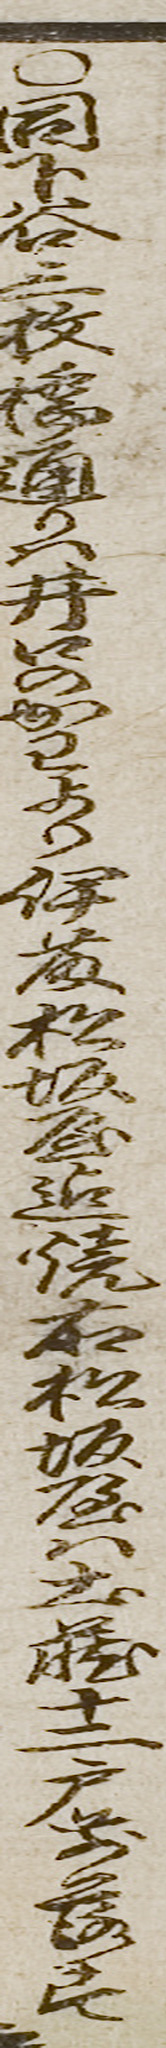○同下谷三枚橋通りハ井口のかわより伊藤松坂屋迄焼右松坂屋ハ土蔵十二戸前落す
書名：江戸大地震出火場所分
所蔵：東京大学総合図書館 General Library in the University of Tokyo, JAPAN
